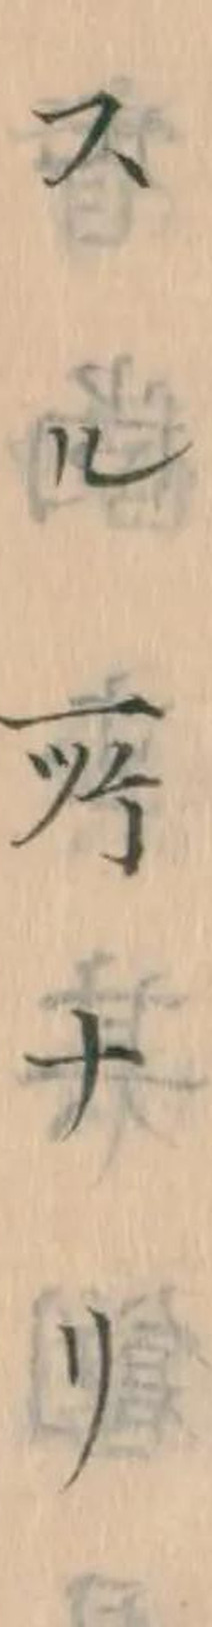スル所ナリ
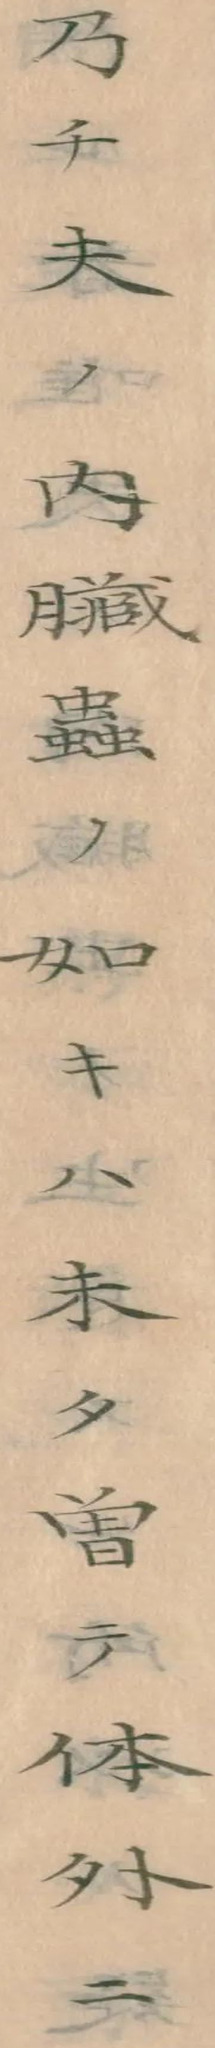乃チ夫ノ内臓虫ノ如キハ未タ曽テ体外ニ
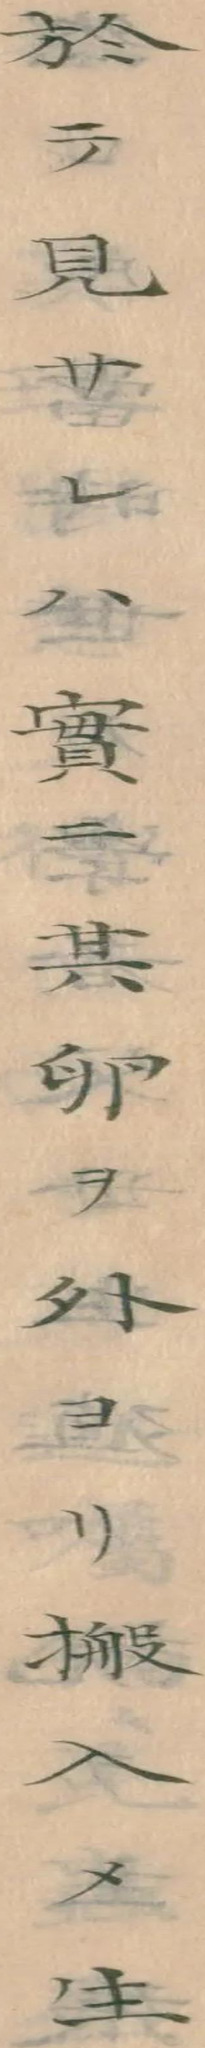於テ見サレハ実ニ其卵ヲ外ヨリ搬入シテ生
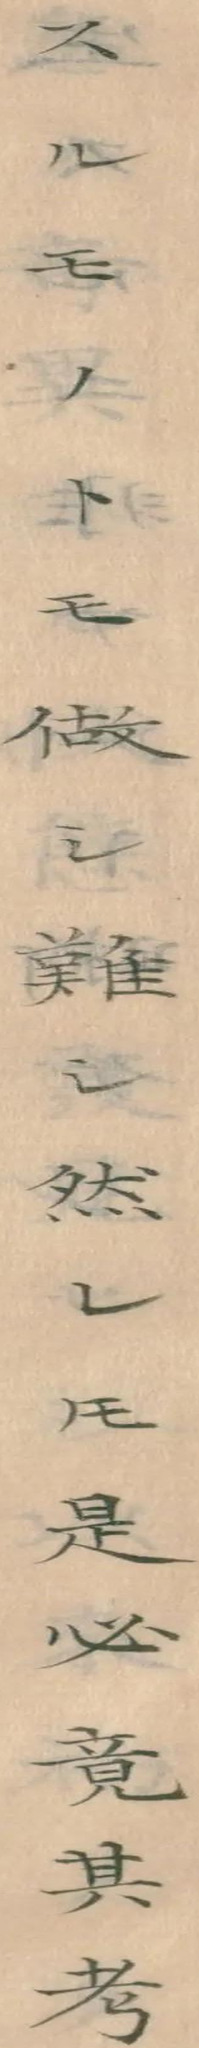スルモノトモ做シ難シ然レトモ是必竟其考
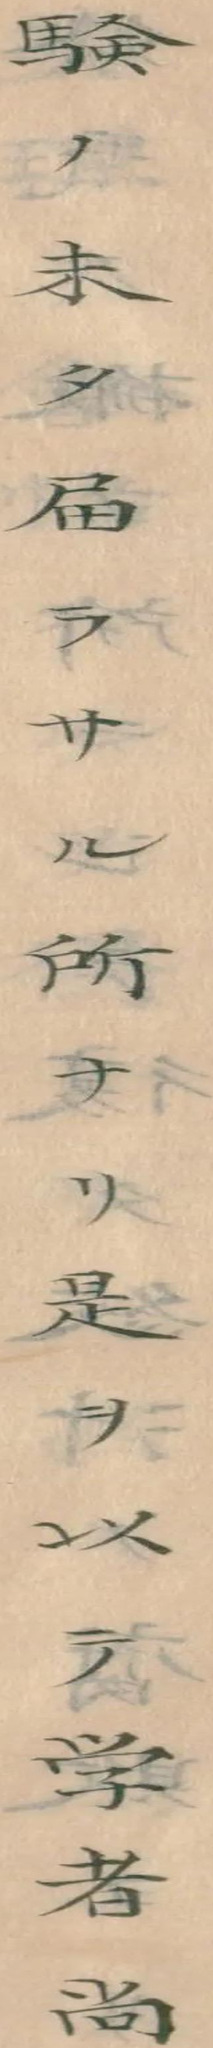験ノ未タ届ラサル所ナリ是ヲ以テ学者尚
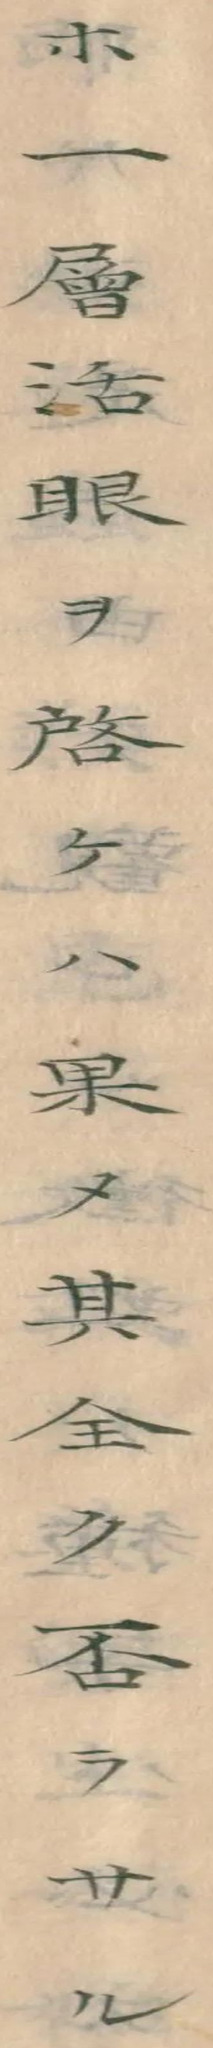ホ一層活眼ヲ啓ケハ果シテ其全ク否ラサル
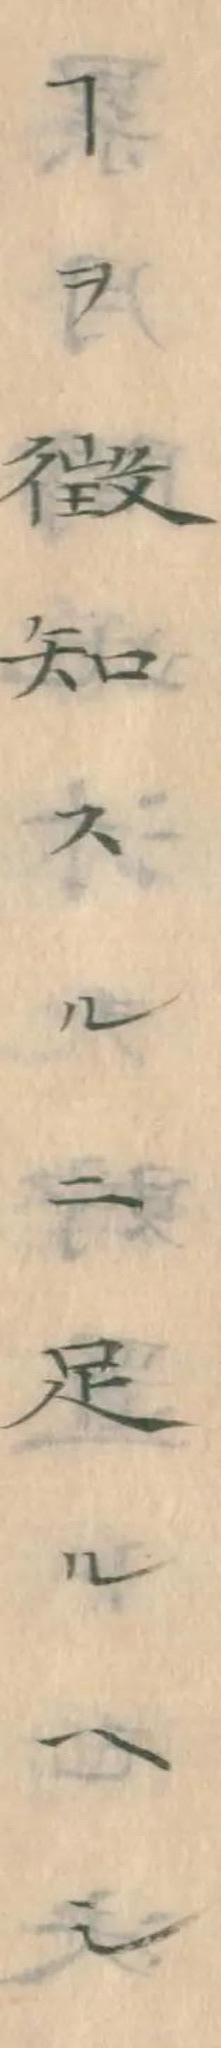コトヲ徴知スルニ足ルヘシ
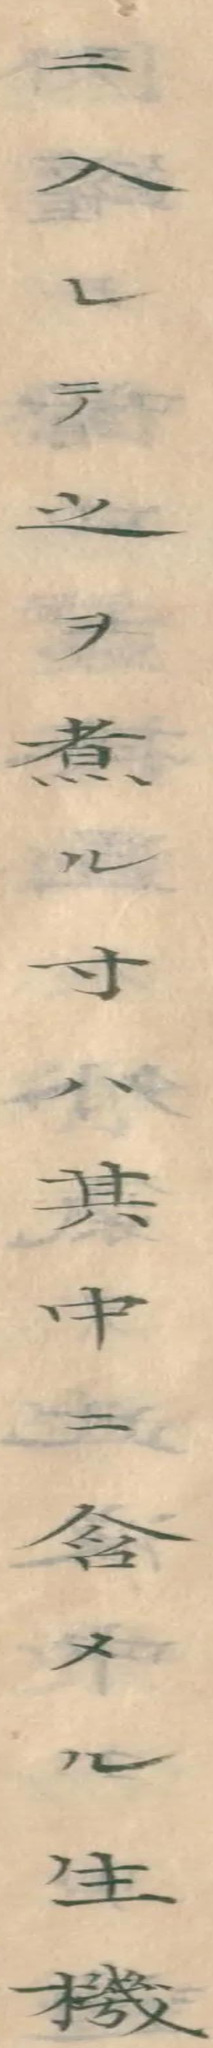ニ入レテ之ヲ煮ルトキハ其中ニ含メル生機
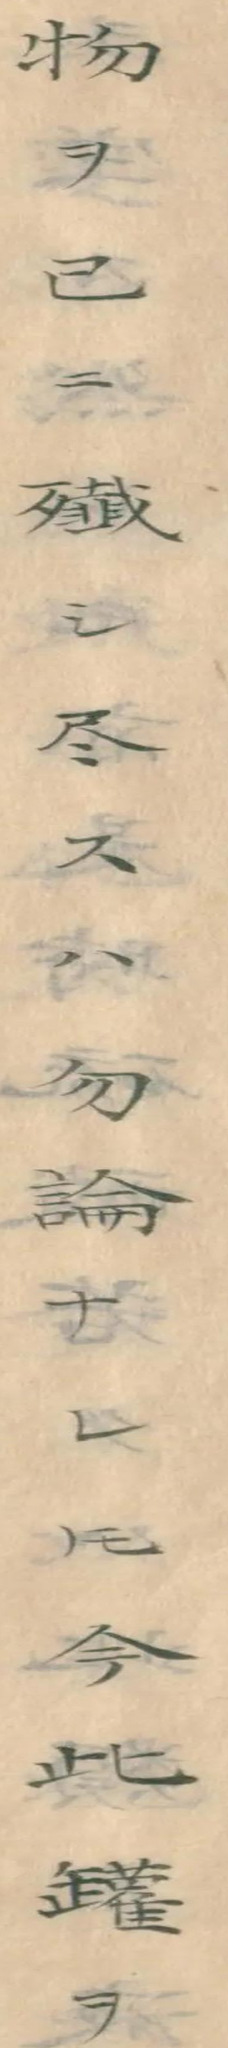物ヲ已ニ殱シ尽スハ勿論ナレトモ今此缶ヲ
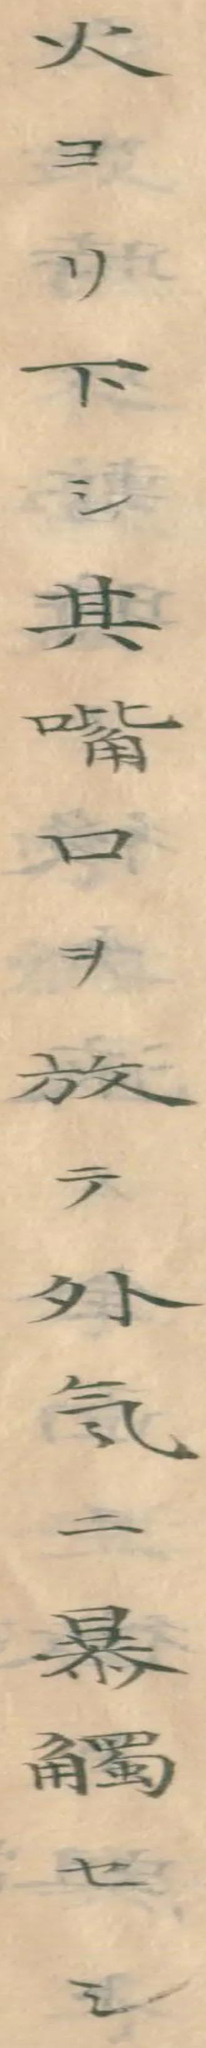火ヨリ下シ其嘴口ヲ放テ外気ニ暴触セシ

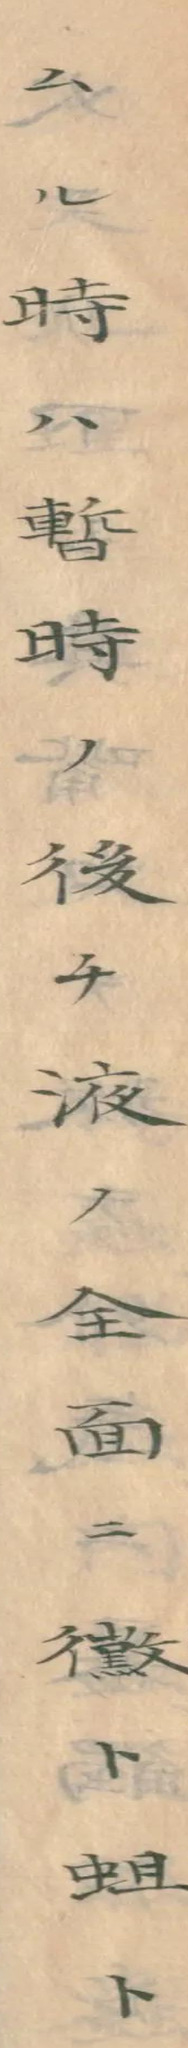ムル時ハ暫時ノ後チ液ノ全面ニ黴ト蛆ト
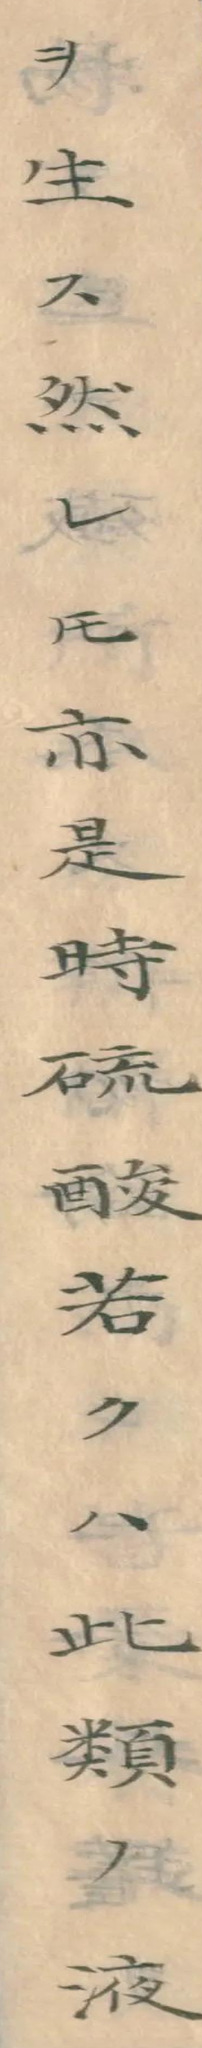ヲ生ス然レトモ亦是時硫酸若クハ此類ノ液
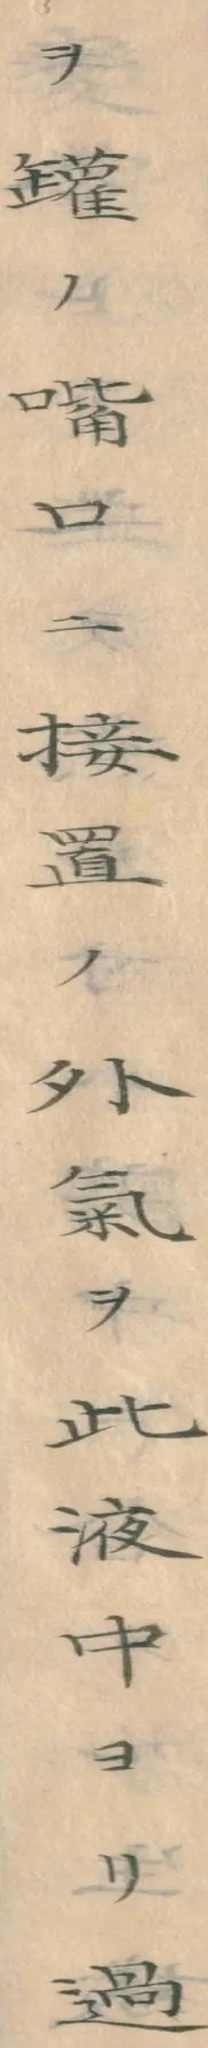ヲ缶ノ嘴口ニ接置ノ外気ヲ此液中ヨリ過
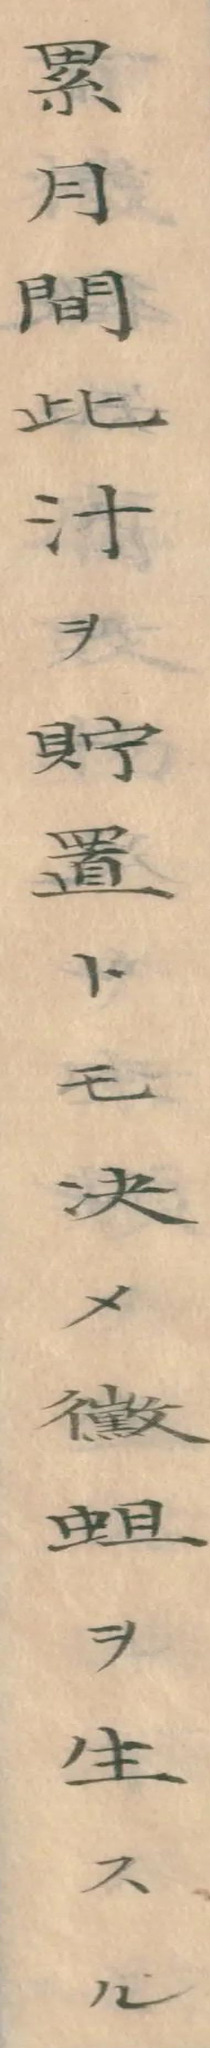累月間此汁ヲ貯置トモ決シテ黴蛆ヲ生スル
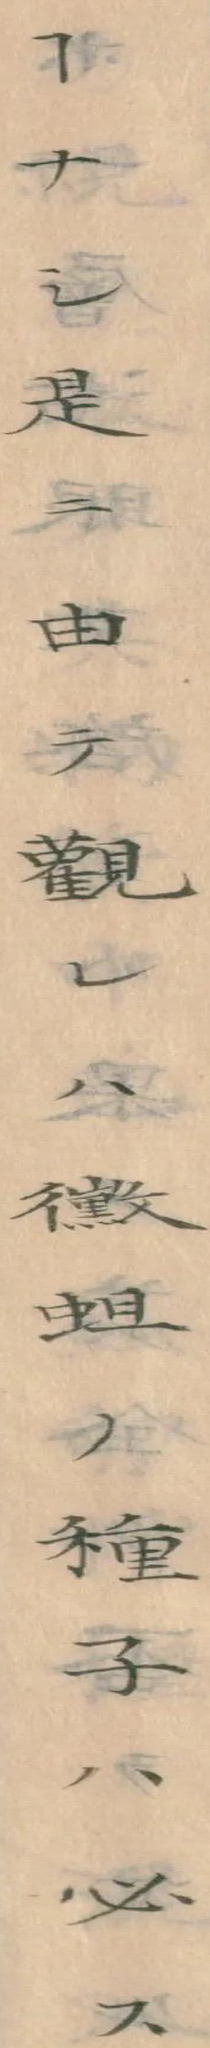コトナシ是ニ由テ観レハ黴蛆ノ種子ハ必ス
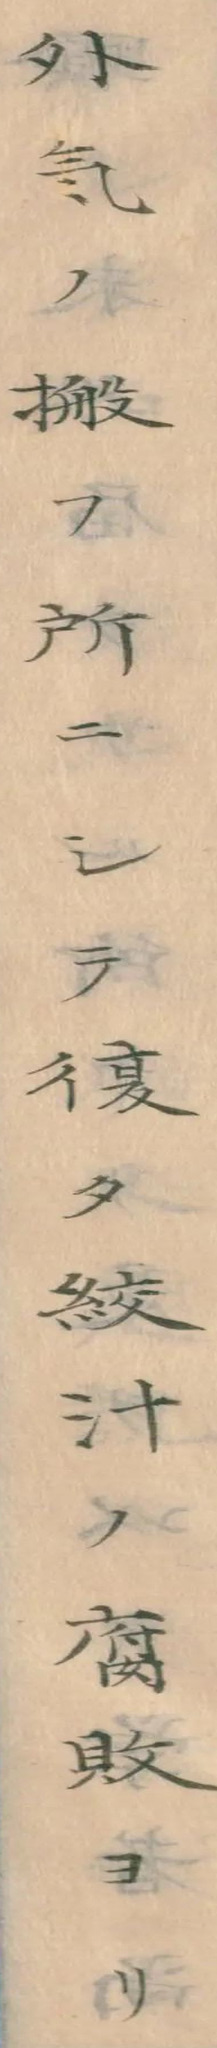外気ノ搬フ所ニシテ復タ絞汁ノ腐敗ヨリ
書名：蚕桑集成
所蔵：国立国会図書館 National Diet Library, JAPAN
